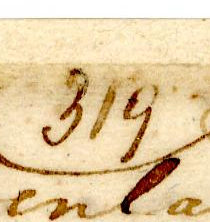319
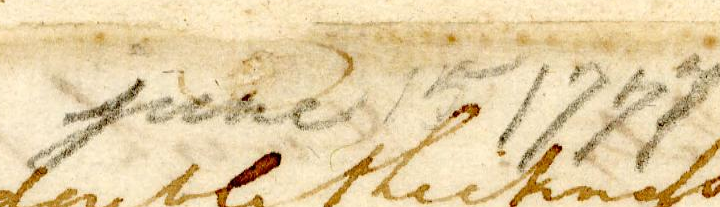June 15 1777
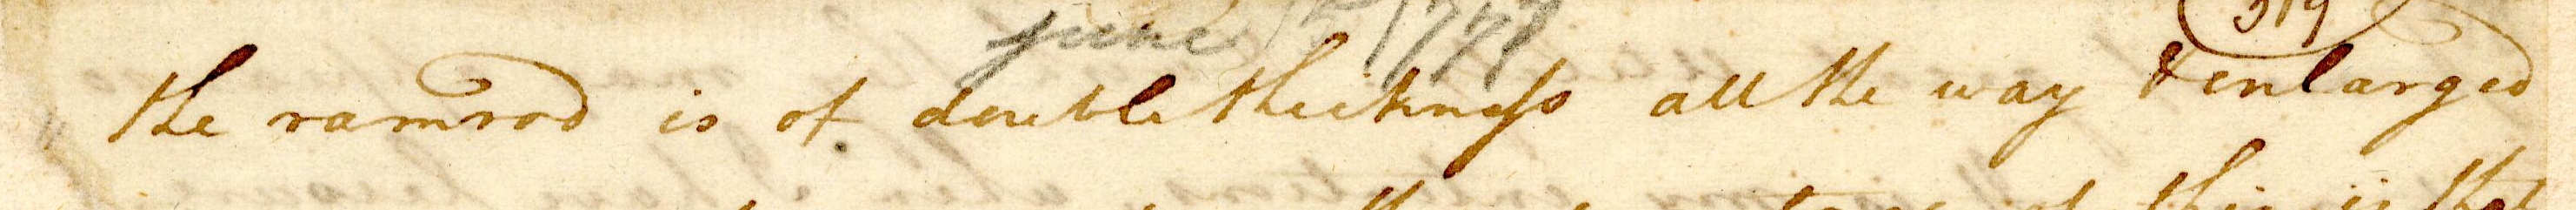The ramrod is of double thickness all the way & enlarged
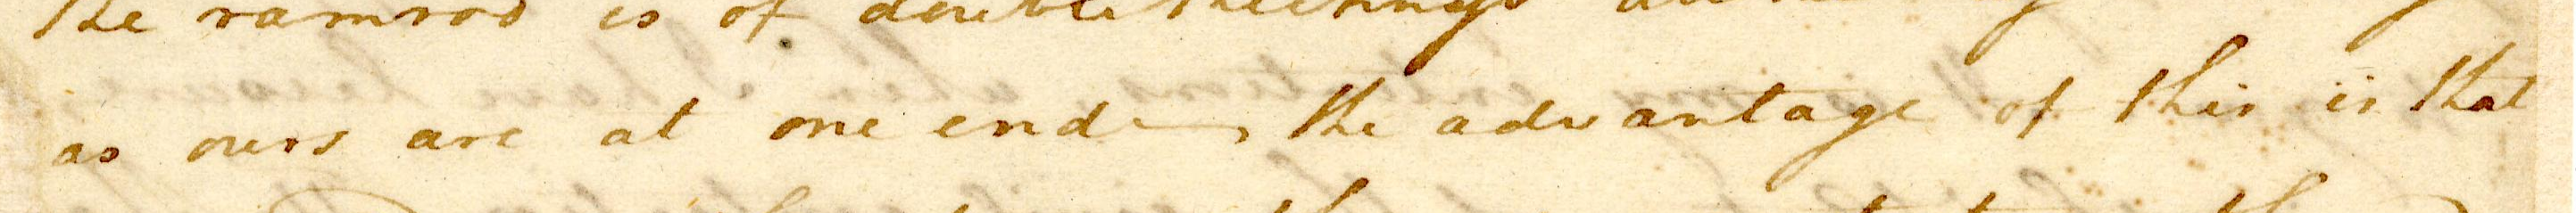as ours are at one end, the advantage of this is that
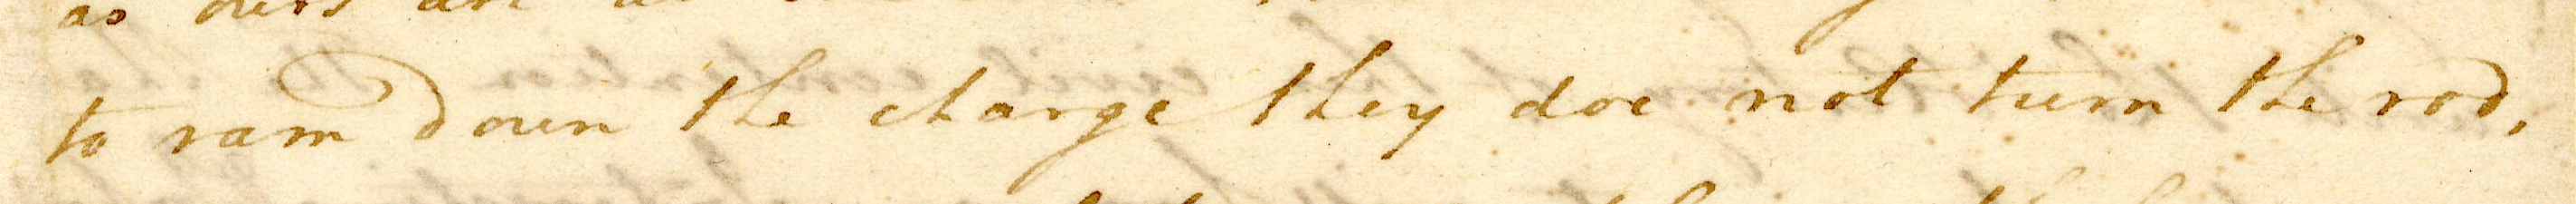to ram doun the charge they doe not turn the rod,
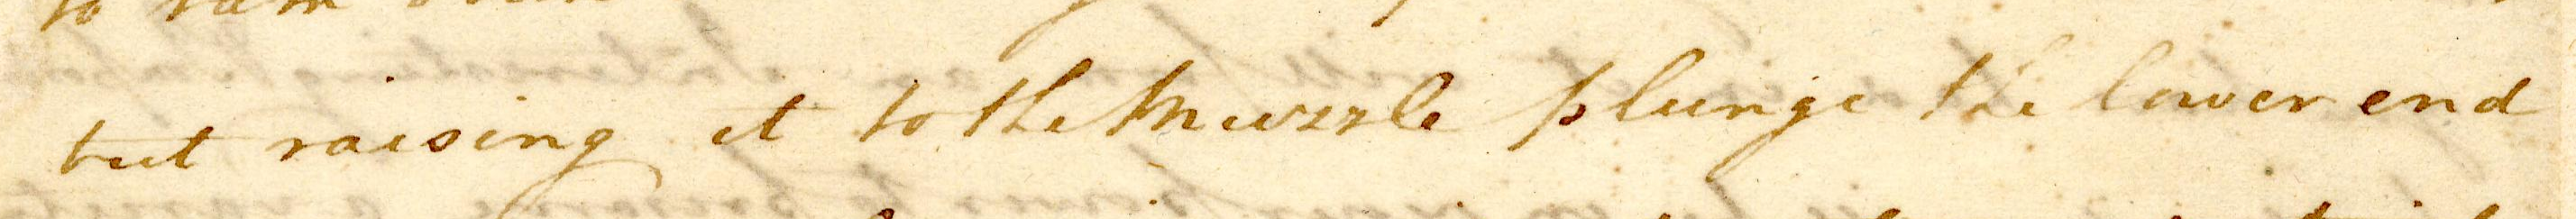but raising it to the Muzzle plunge the lower end
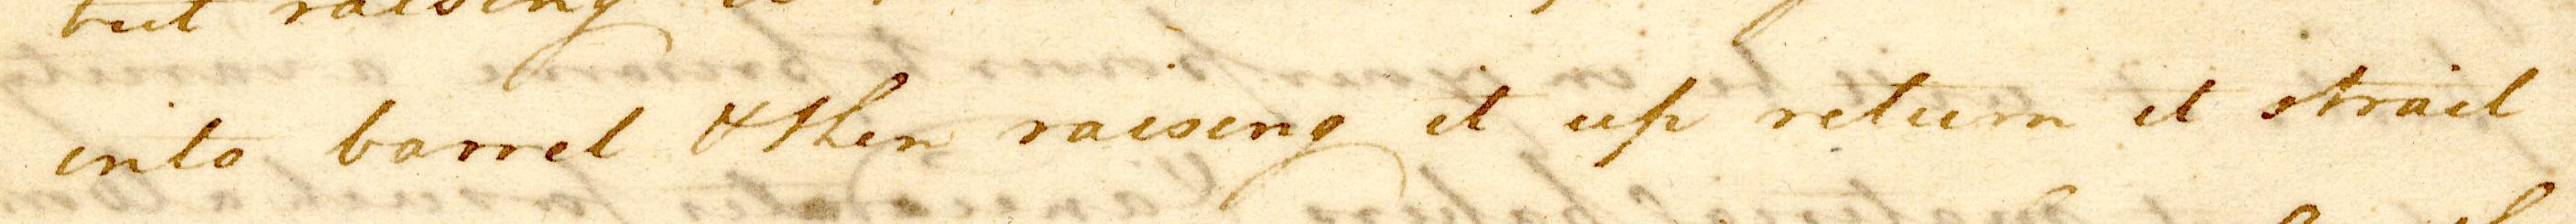into barrel & then raising it up return it strait
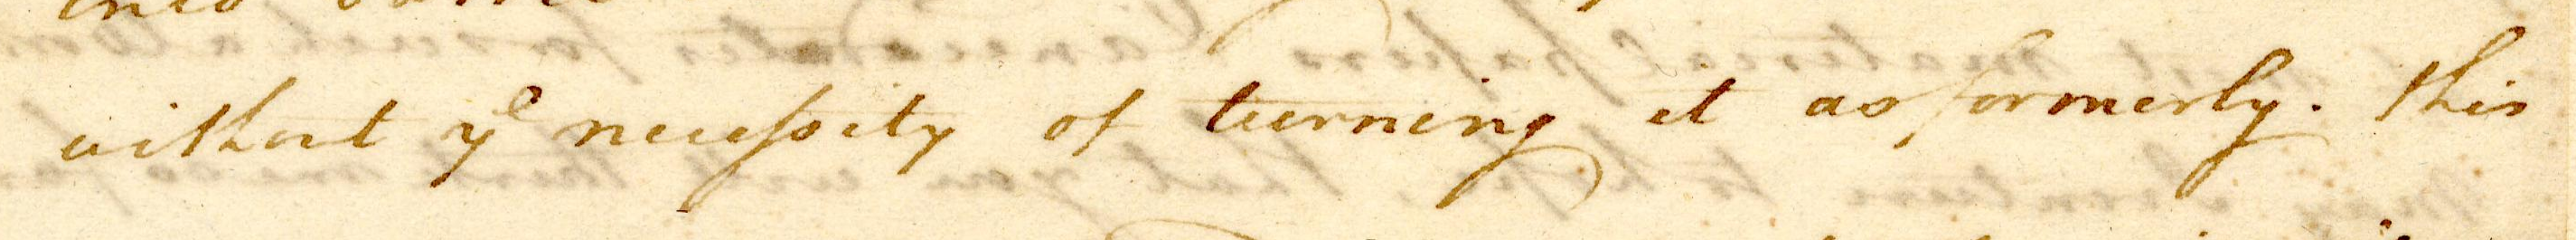without y^e necessity of turning it as formerly. this
